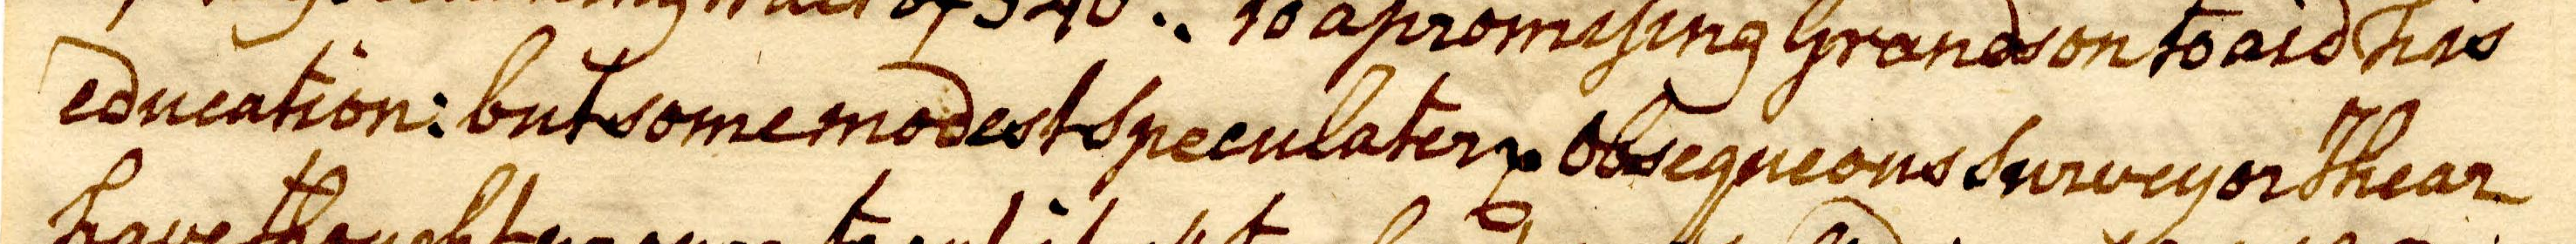education: but some modest speculater & Obsequeous Surveyor I hear
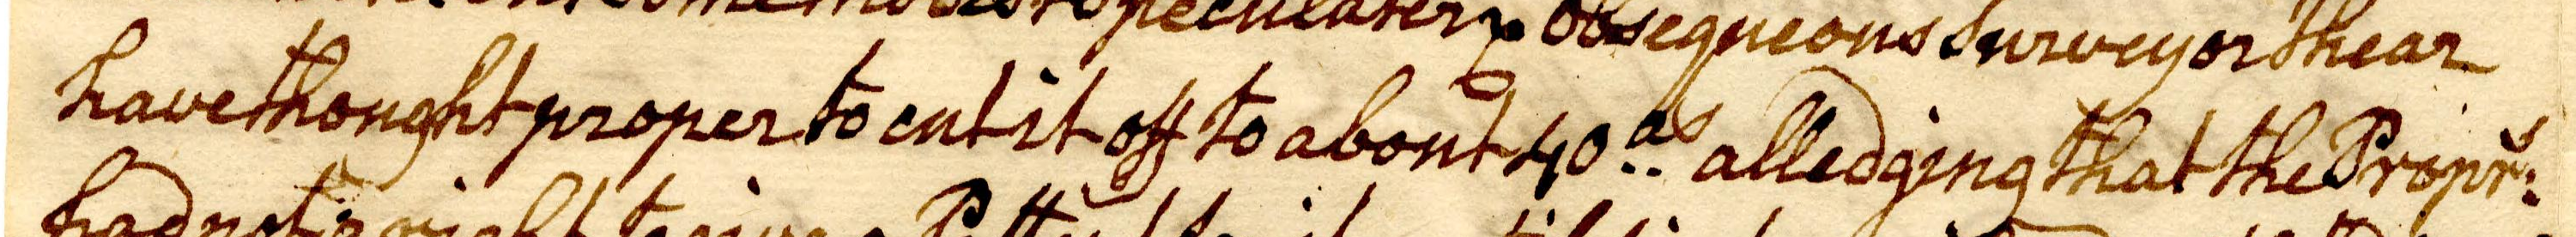have thought proper to cut it off to about 40^as: alledging that the Propr:^s
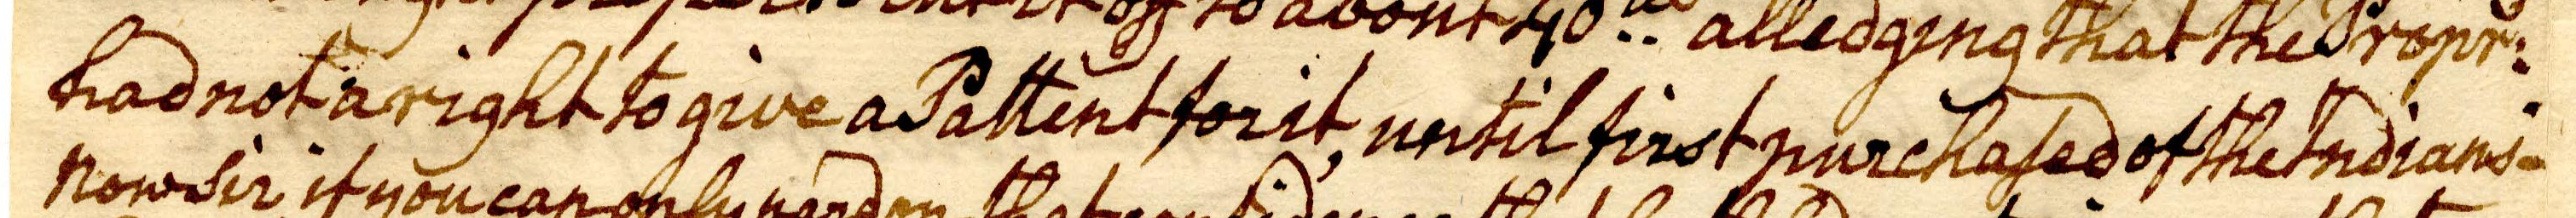had not a right to give a Pattent for it, until first purchased of the Indians-
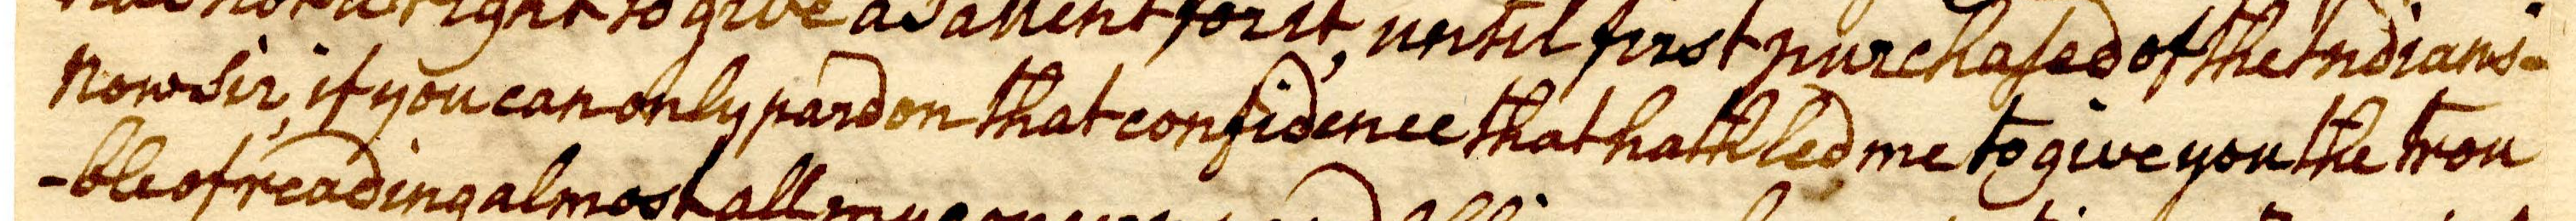now Sir, if you can only pardon that confidence that hath led me to give you the trou
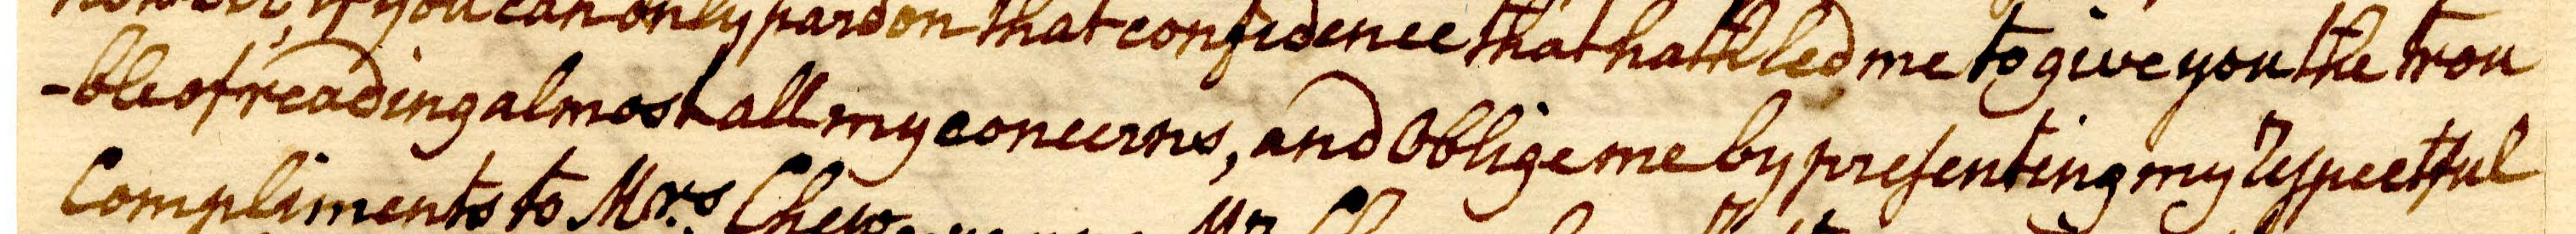-ble of reading almost all my concerns, and Oblige me by presenting my respectful
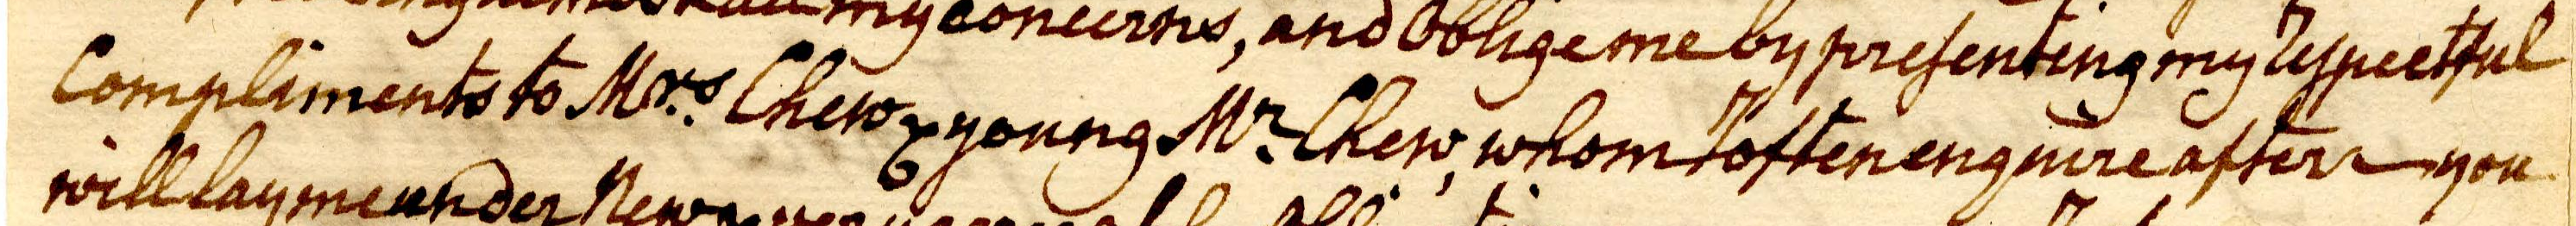Compliments to M^rs. Chew & young M^r. Chew, whom I often enquire after- you
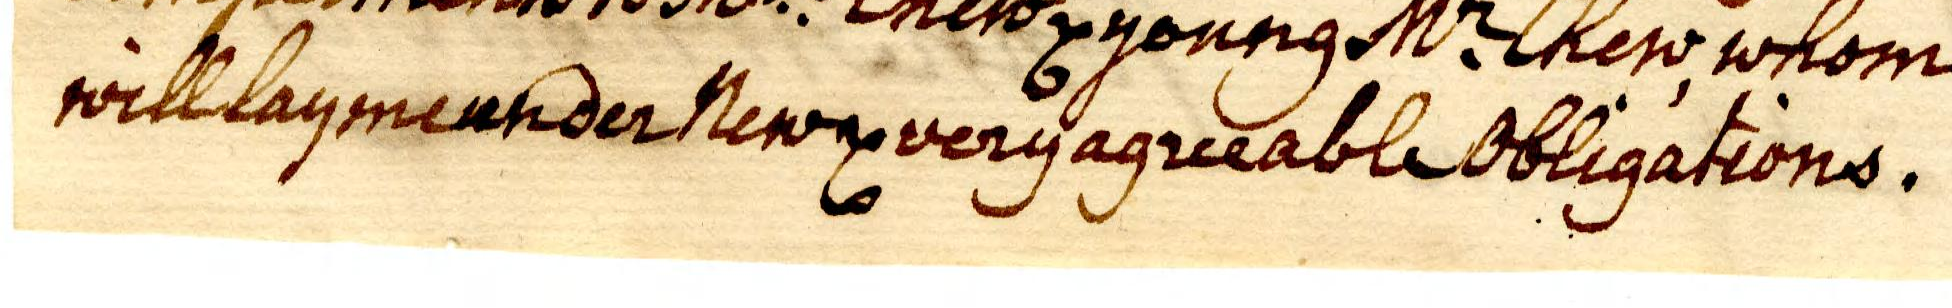will lay me under New & very agreeable Obligations.
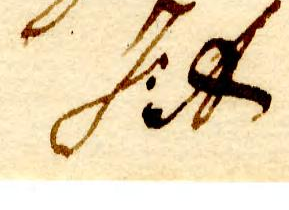J.A
